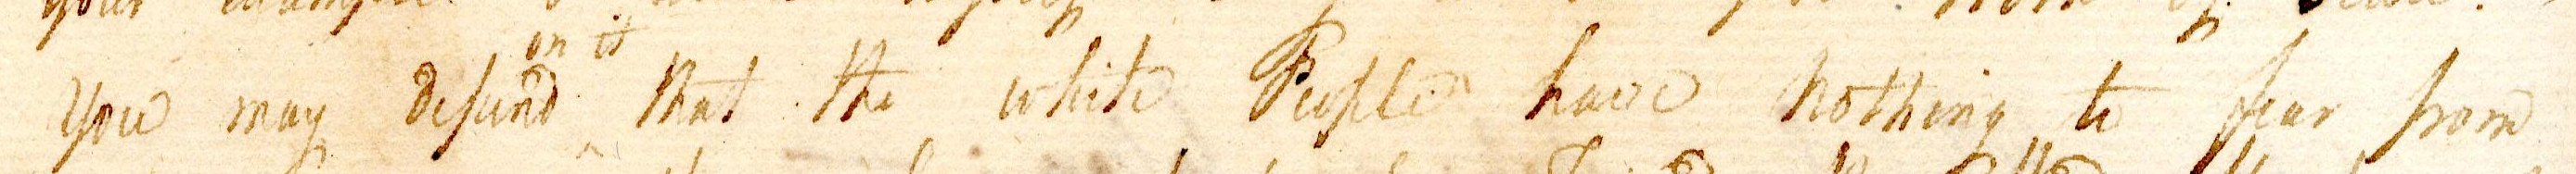You may depend ^on it that the white People have nothing to fear from
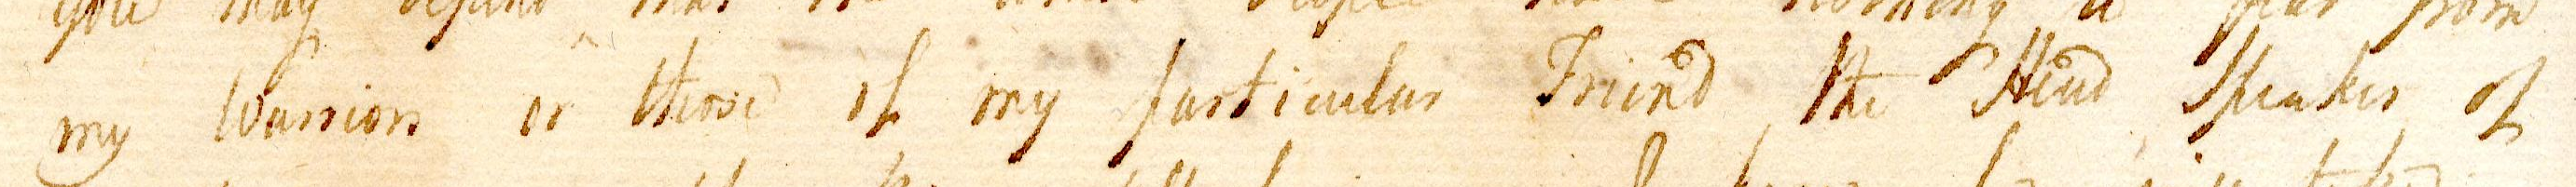my Warriors or those of my particular Friend the Head Speaker of
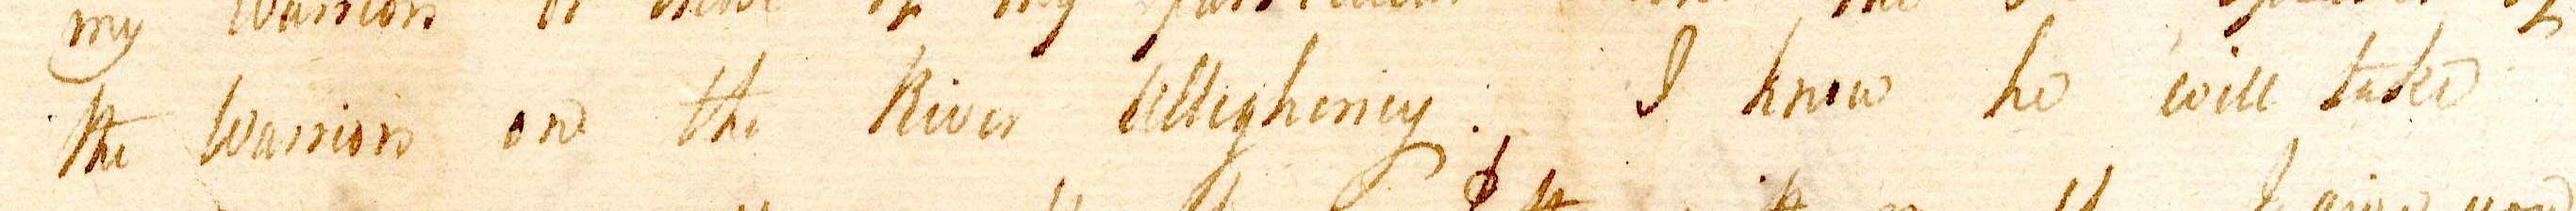the Warriors on the River Allegheney. I know he will take
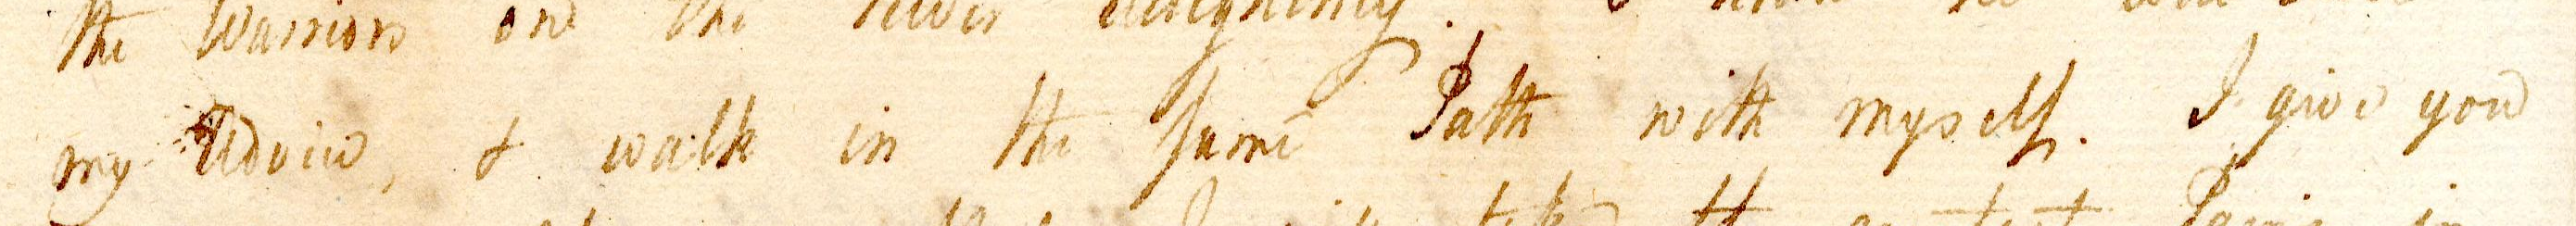my Advice & walk in the same Path with myself. I give you
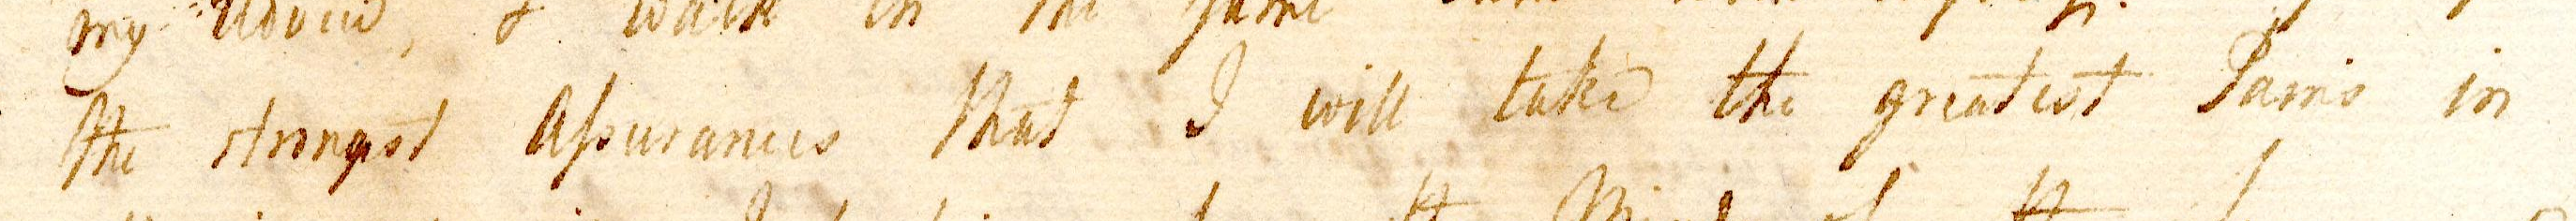the strongest assurances that I will take the greatest Pains in
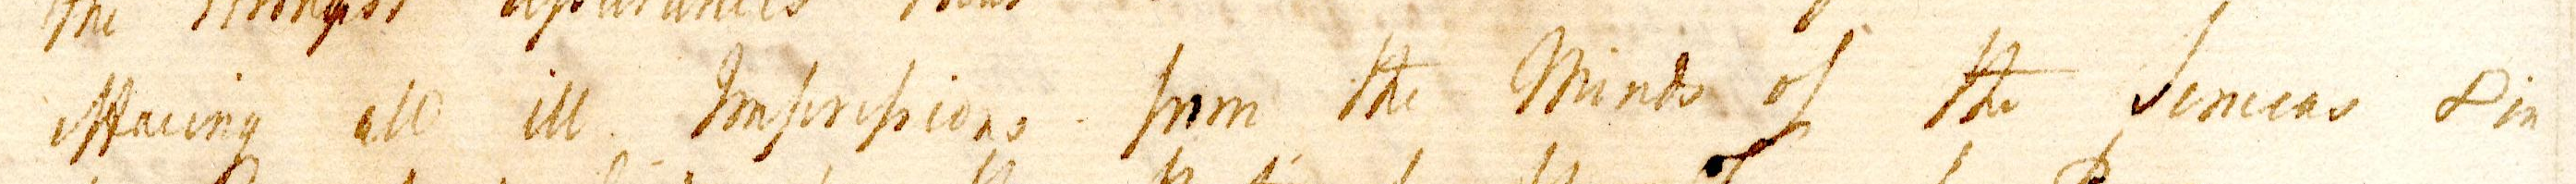effacing all ill Impressions from the Minds of the Senecas & in
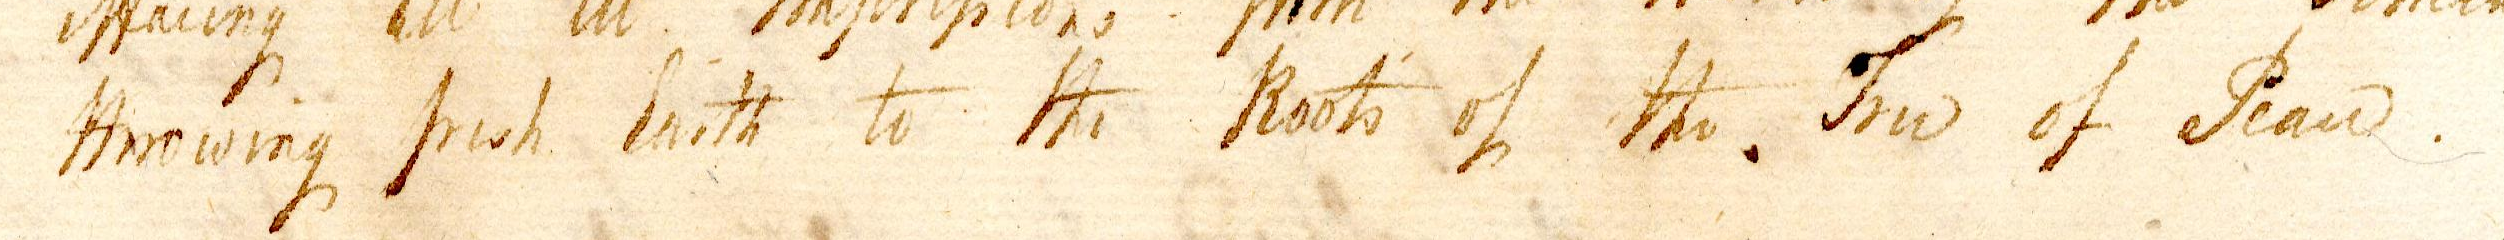throwing fresh earth to the Roots of the Tree of Peace.
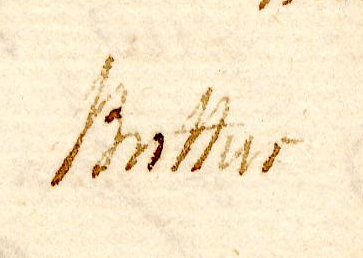Brother
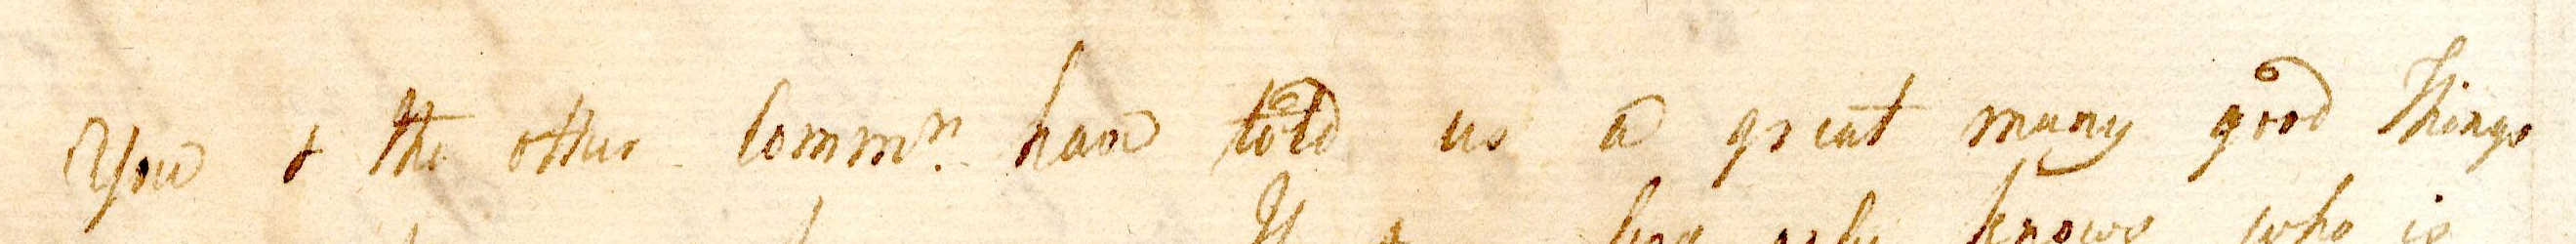You & the other Comm^r. have told us a great many good things
